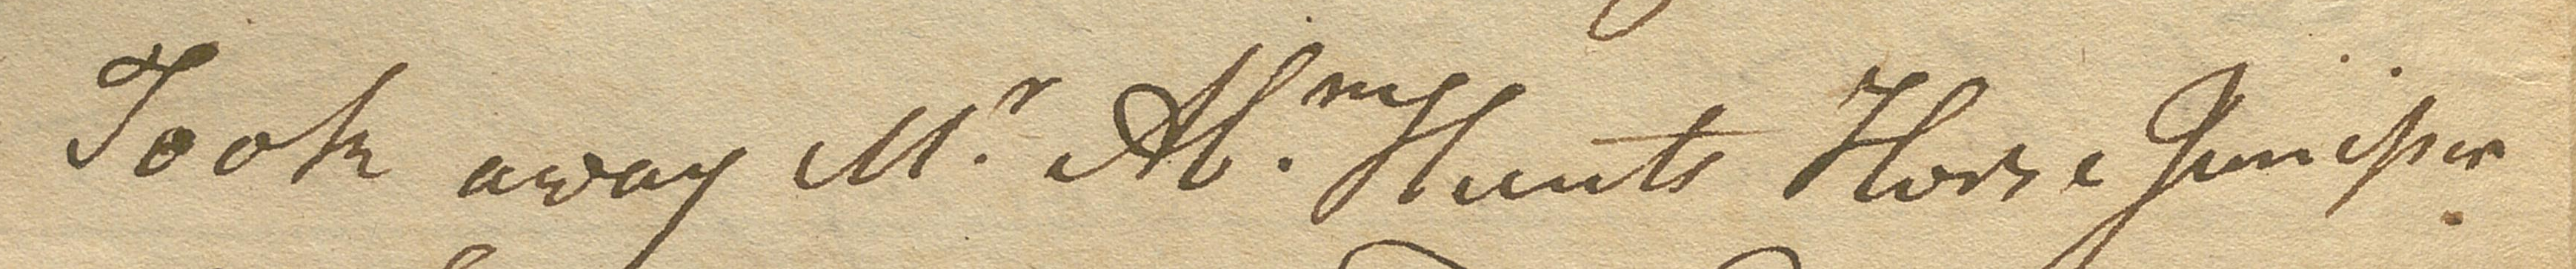Took away M^r. Ab^m. Hunts Horse Juniper
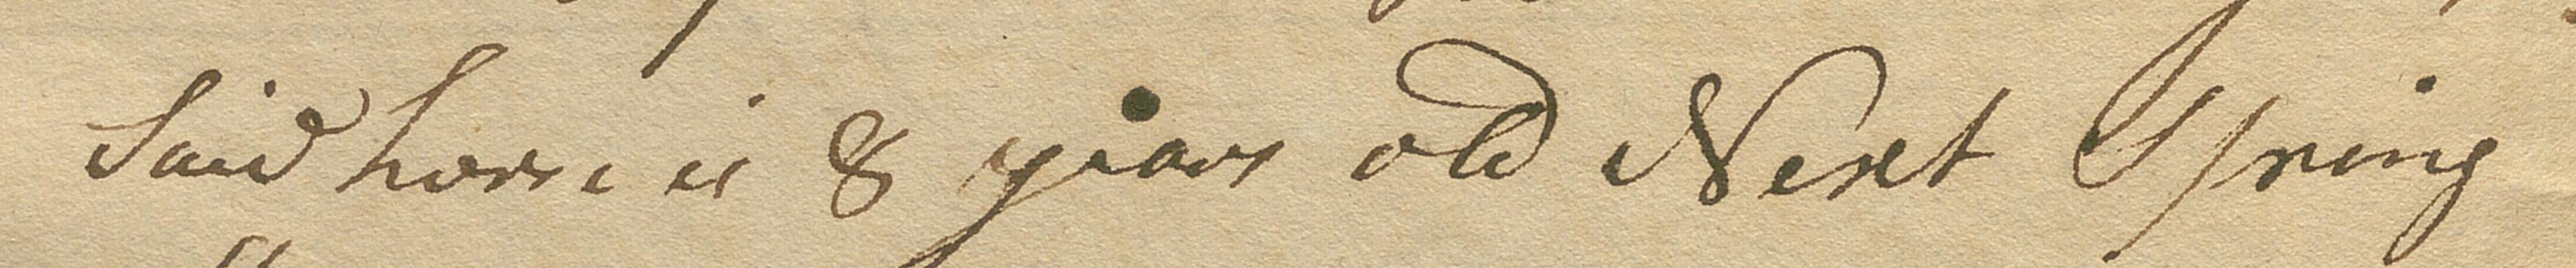said horse is 8 years old Next spring
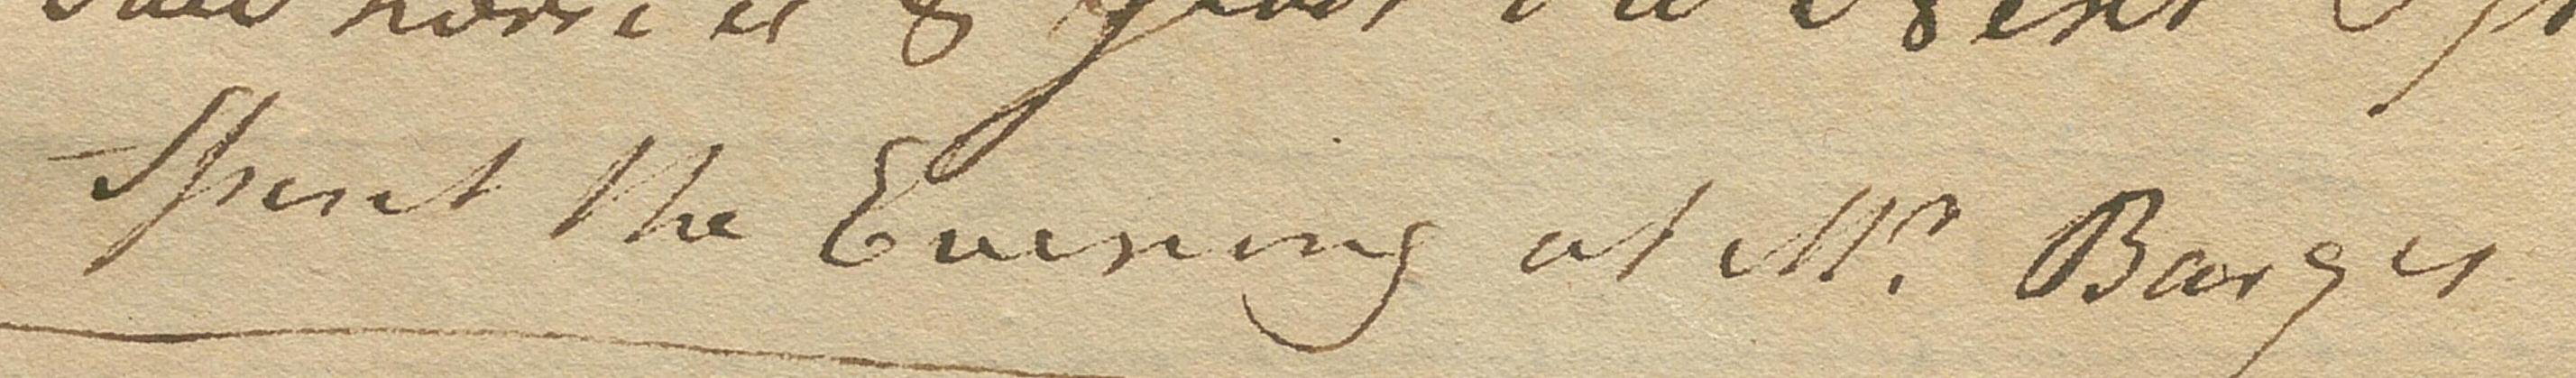spent the Evening at M^r. Barges
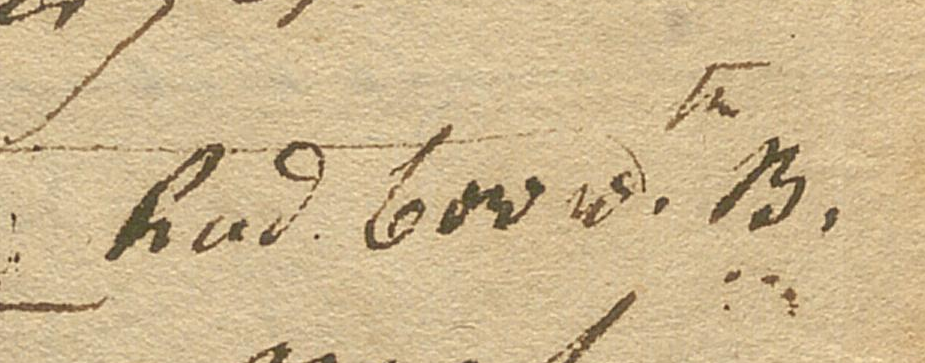had Cow w^th. B.
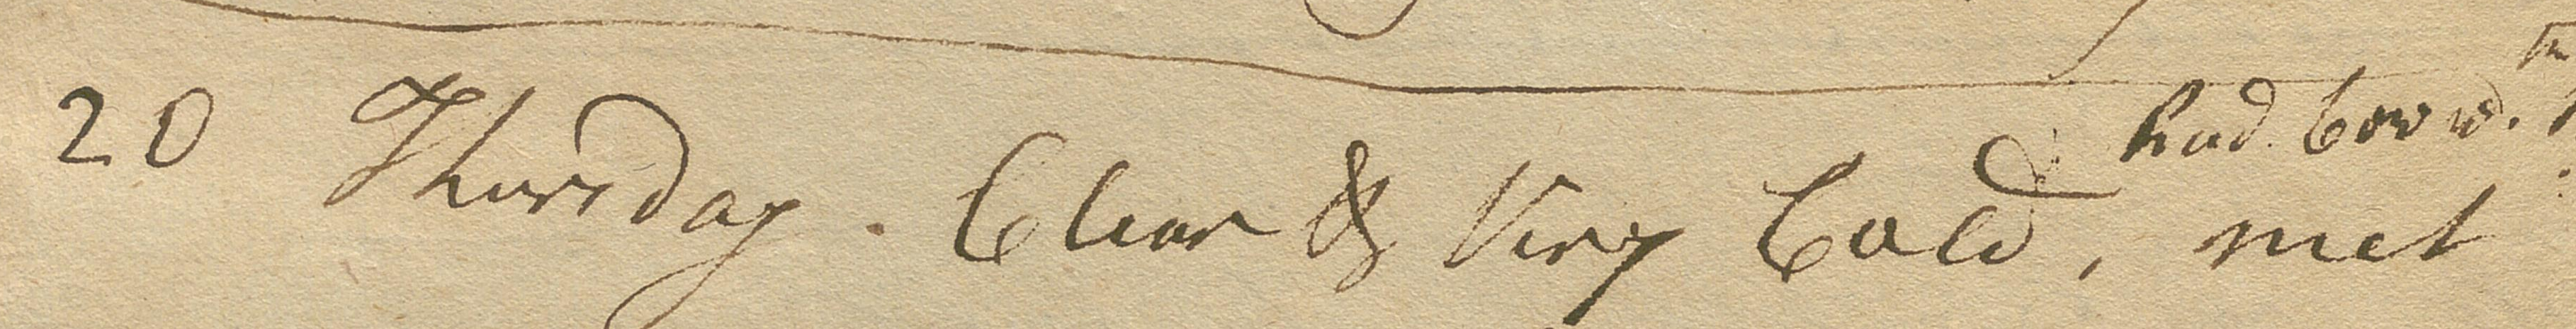20 Thurrday. Clear & Very Cold, met
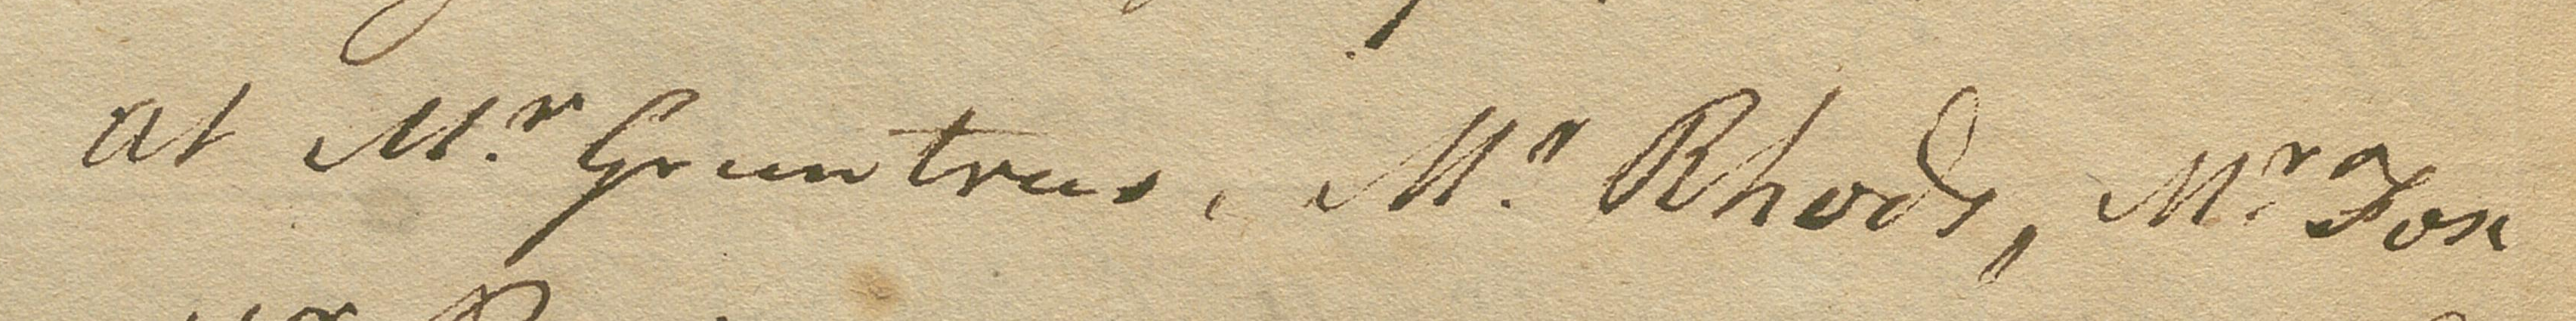at M^r. Greentrees, M^r. Rhods, M^r. Fox
